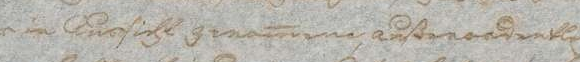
in Aussicht genommene außerordentlich
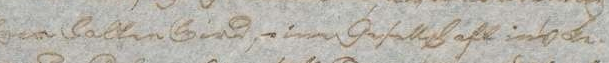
schwer halten wird, eine Gesellschft ins Le-
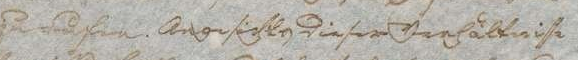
ben zu rufen. Angesichts dieser Verhältnisse
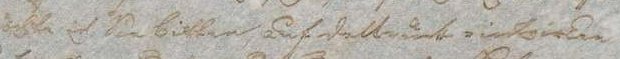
möchte ich Sie bitten, auf Delbrück einwirken
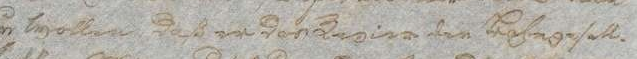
zu wollen, daß er das Revier der Bahngesell-
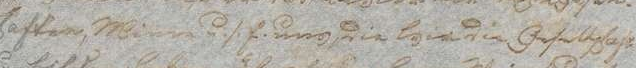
schaften, Minen u. s. f. uns, die wir die Gesellschaft
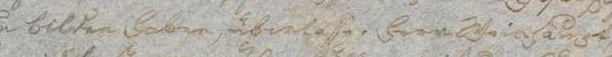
zu bilden haben, überlasse. Herr Weishaupt,
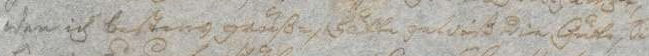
den ich bestens grüße, hätte gewiß die Güte, Sie
